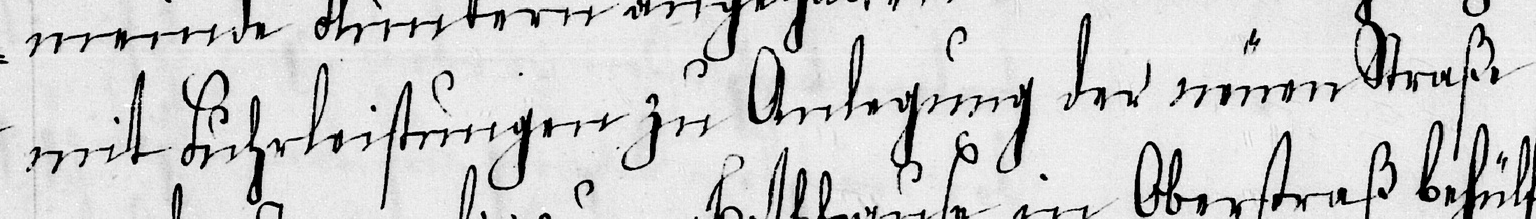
mit Fuhrleistungen zu Anlegung der neuen Straße
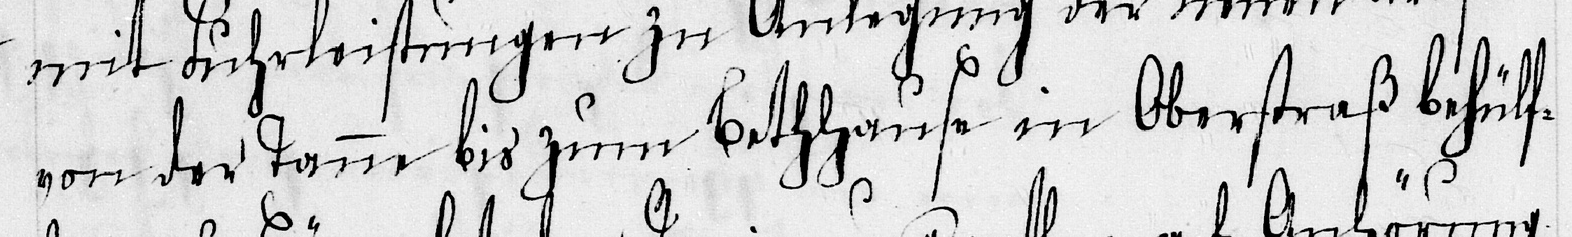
von der Tanne bis zum Bethhause in Oberstraß behülf¬
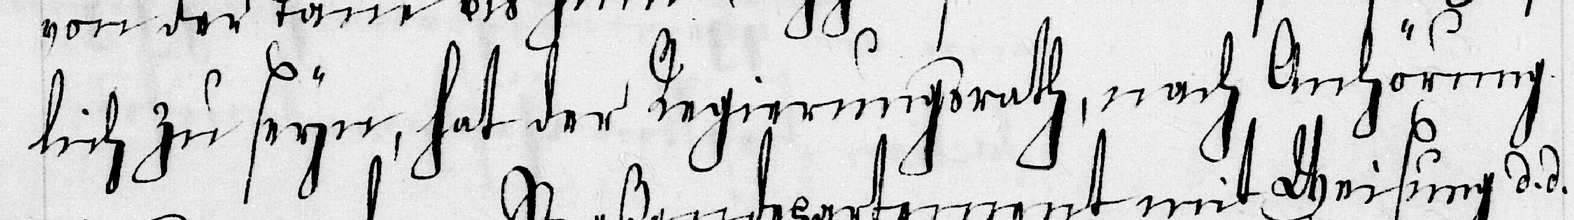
lich zu seyn, hat der Regierungsrath, nach Anhörung
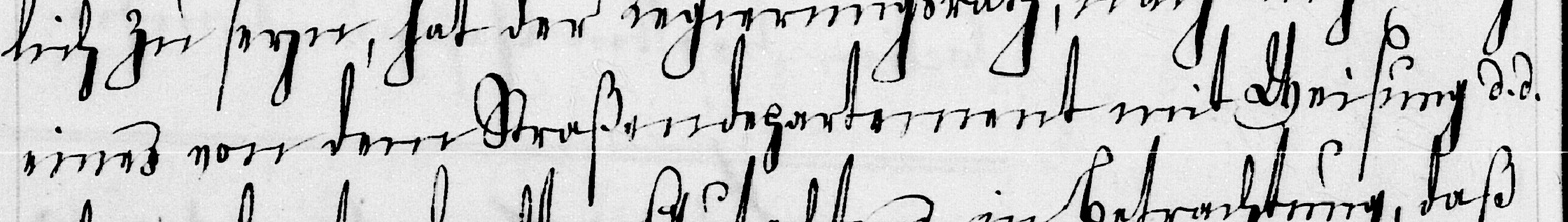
eines von dem Straßendepartement mit Weisung d. d.
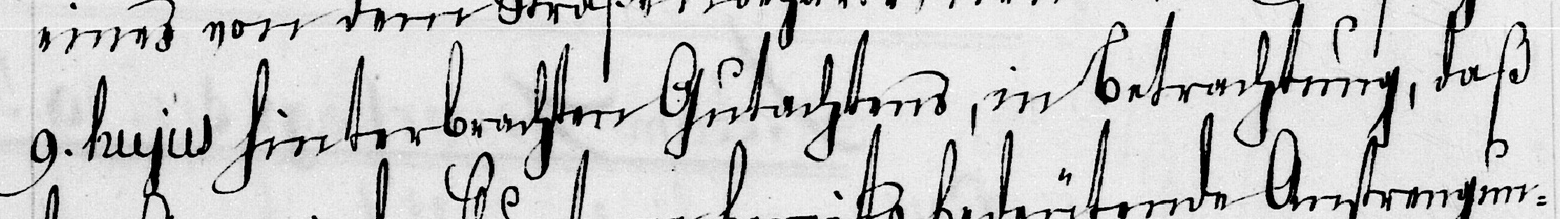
9. hujus hinterbrachten Gutachtens, in Betrachtung, daß
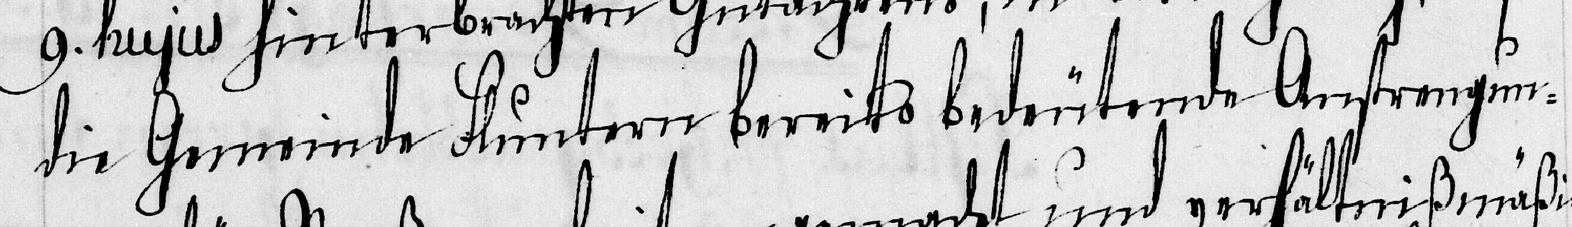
die Gemeinde Fluntern bereits bedeutende Anstrengun¬
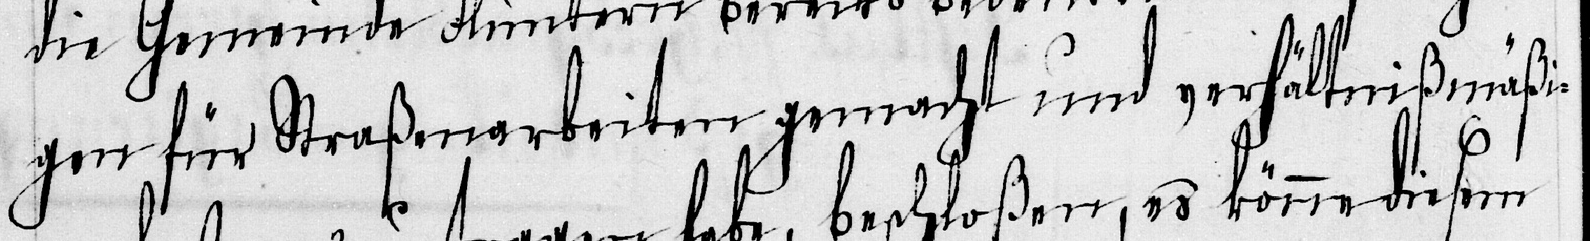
gen für Straßenarbeiten gemacht und verhältnißmäßi¬
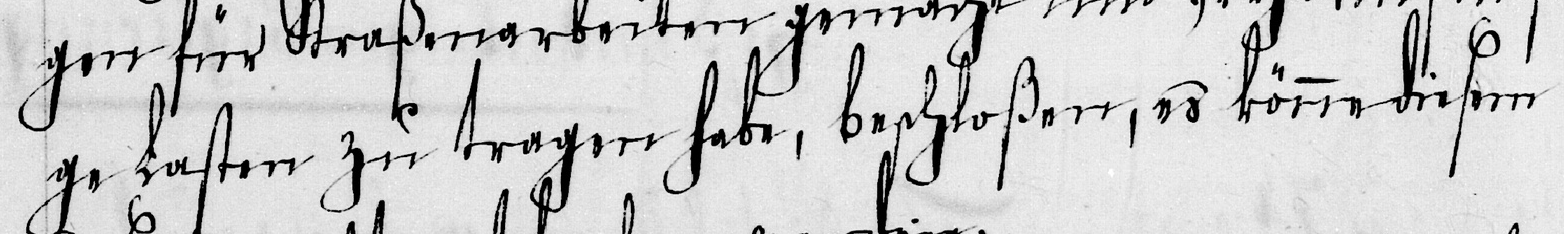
ge Lasten zu tragen habe, beschloßen, es könne diesem
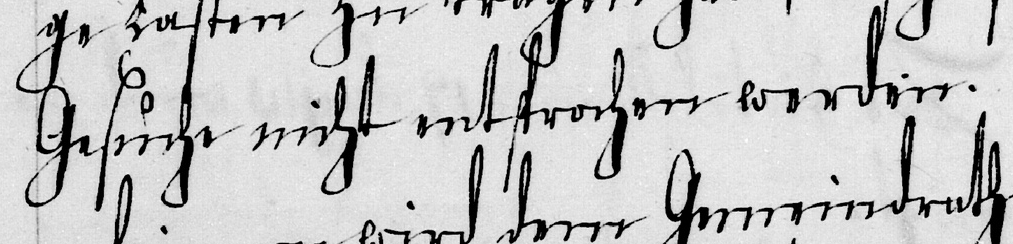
Gesuche nicht entsprochen werden.
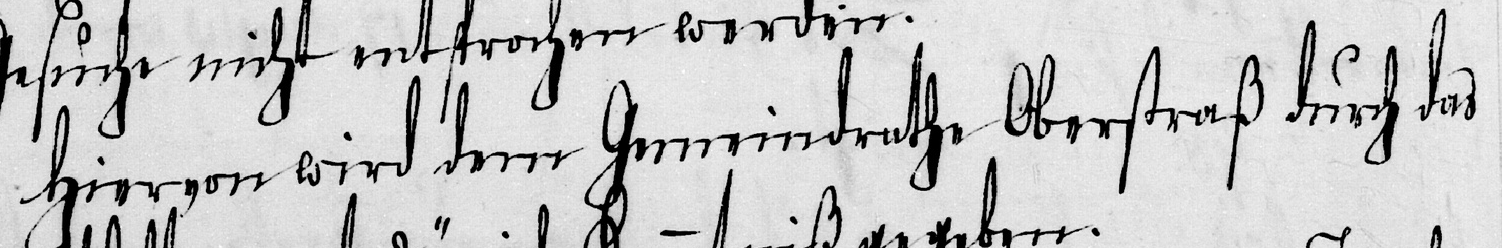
Hiervon wird dem Gemeindrathe Oberstraß durch das
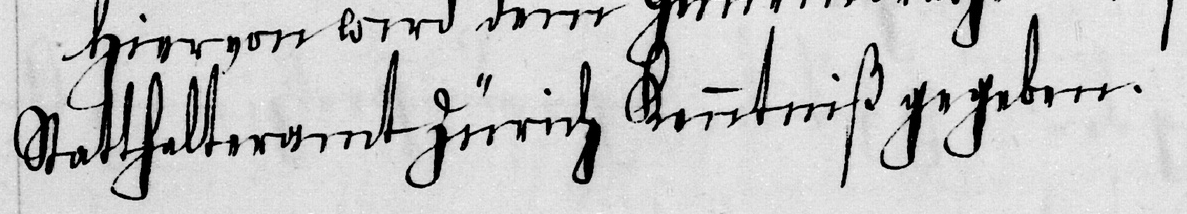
Statthalteramt Zürich Kenntniß gegeben.
